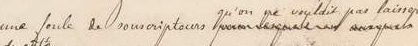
une foule de souscripteurs pour lesquels et auxquelsqu'on ne
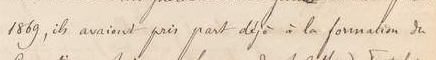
1869, ils avaient pris part déjà à la formation du
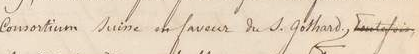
Consortium Suisse en faveur du S. Gothard. Toutefois,
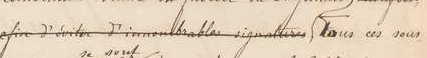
enfin d'éviter d'innombrables signatures Tous ces sous-
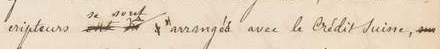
cripteurs on du s'se sont arrangés avec le Crédit Suisse, sur
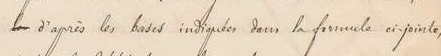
le d'après les bases indiquées dans la formule ci-jointe,
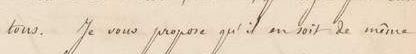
tous. Je vous propose qu'il en soit de même
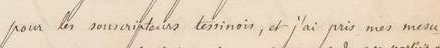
pour les souscripteurs tessinois, et j'ai pris mes mesu-
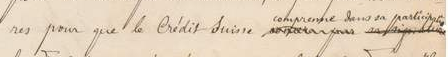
res pour que le Crédit Suisse ... pas sa signaturecomprenne dans sa participation
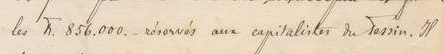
les Fr. 856.000.– réservés aux capitalistes du Tessin. Il
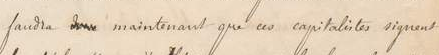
faudra donc maintenant que ces capitalistes signent
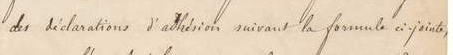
des déclarations d'adhésion suivant la formule ci-jointe,
